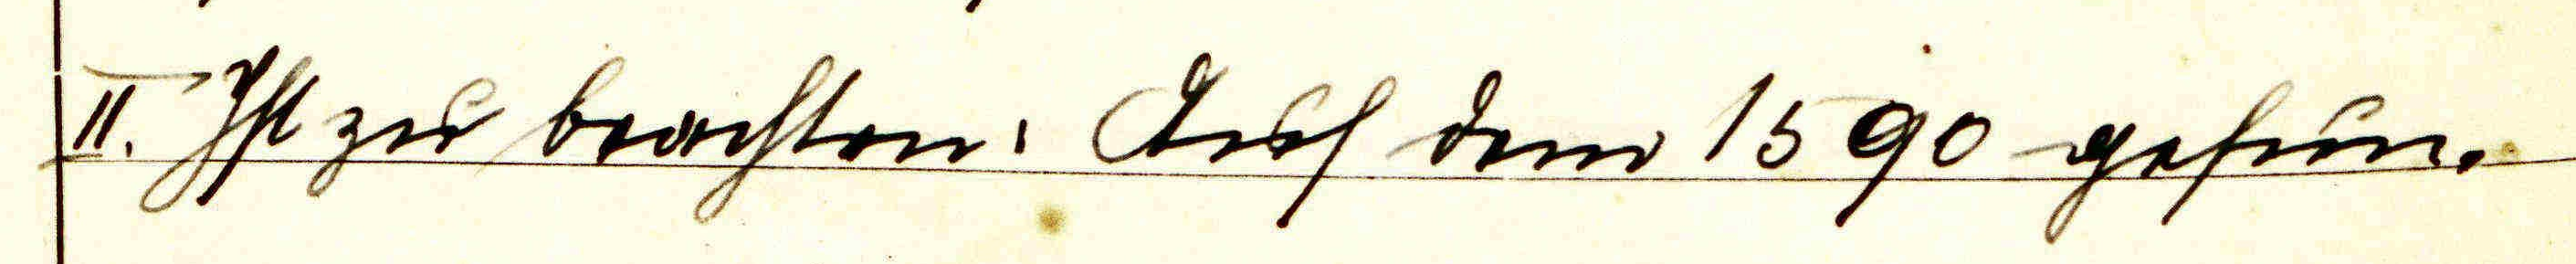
II. Ist zu beachten: Auf dem 1590 gefun-
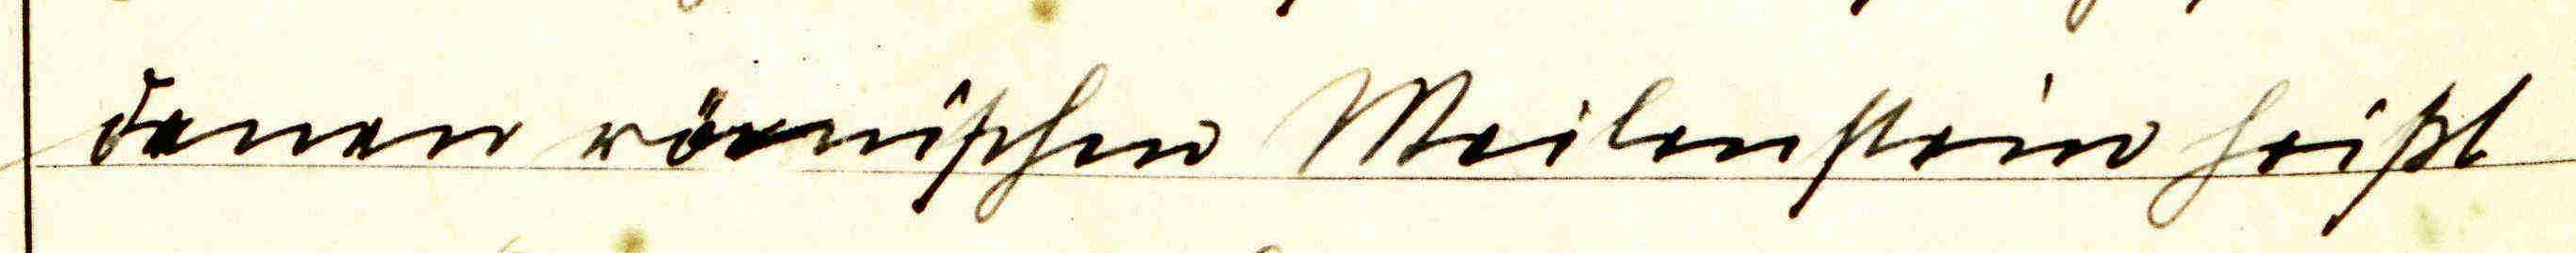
denen römischen Meilenstein heißt
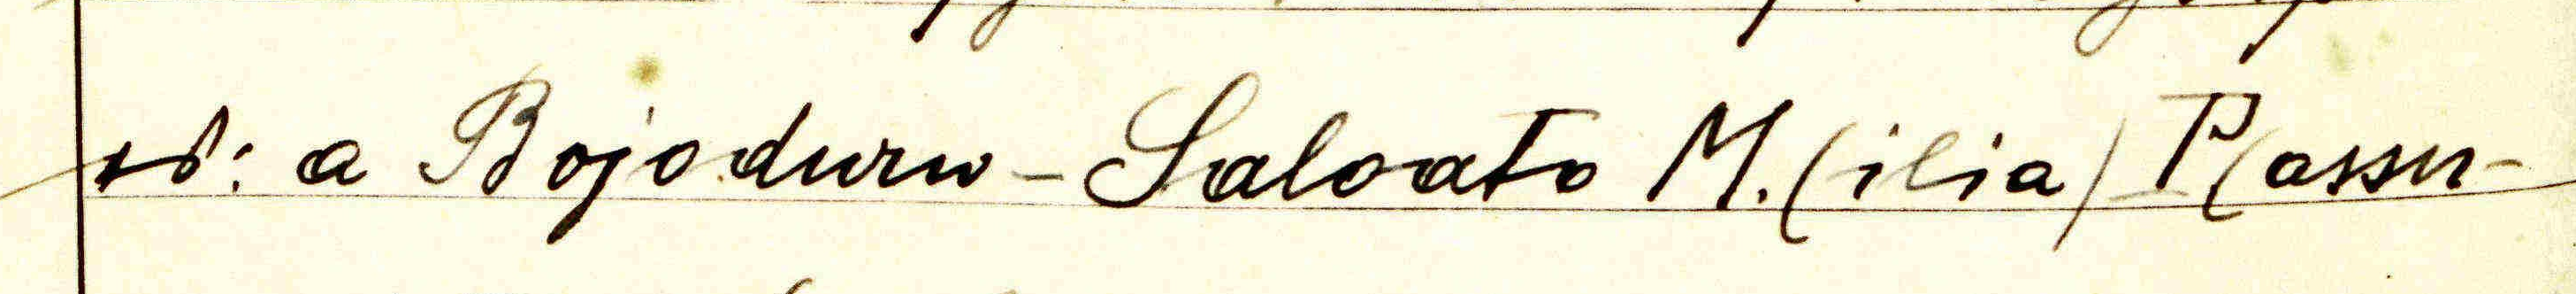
es: a Bojodun-Saloato M.(ilia) P(assu-
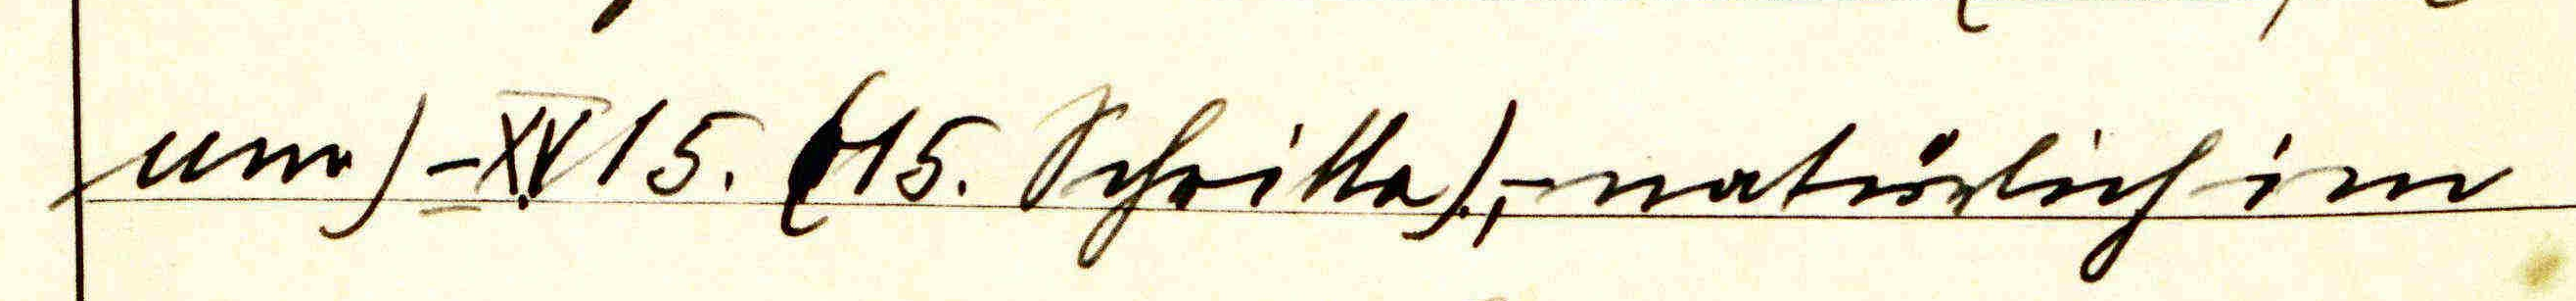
um) – XV 15. (15 Schritte), - natürlich im
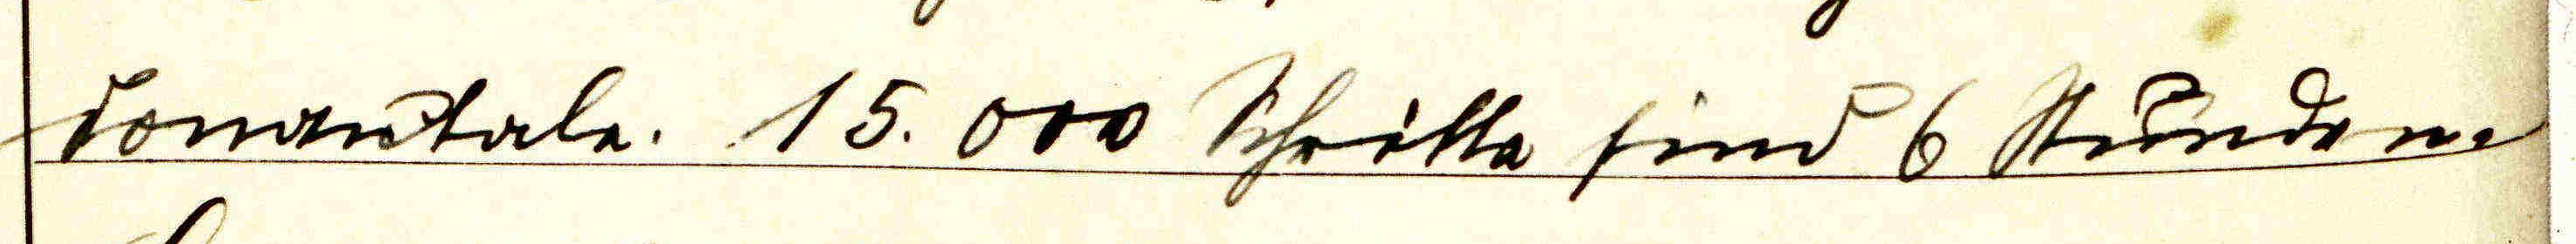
Donautale. 15.000 Schritte sind 6 Stunden.
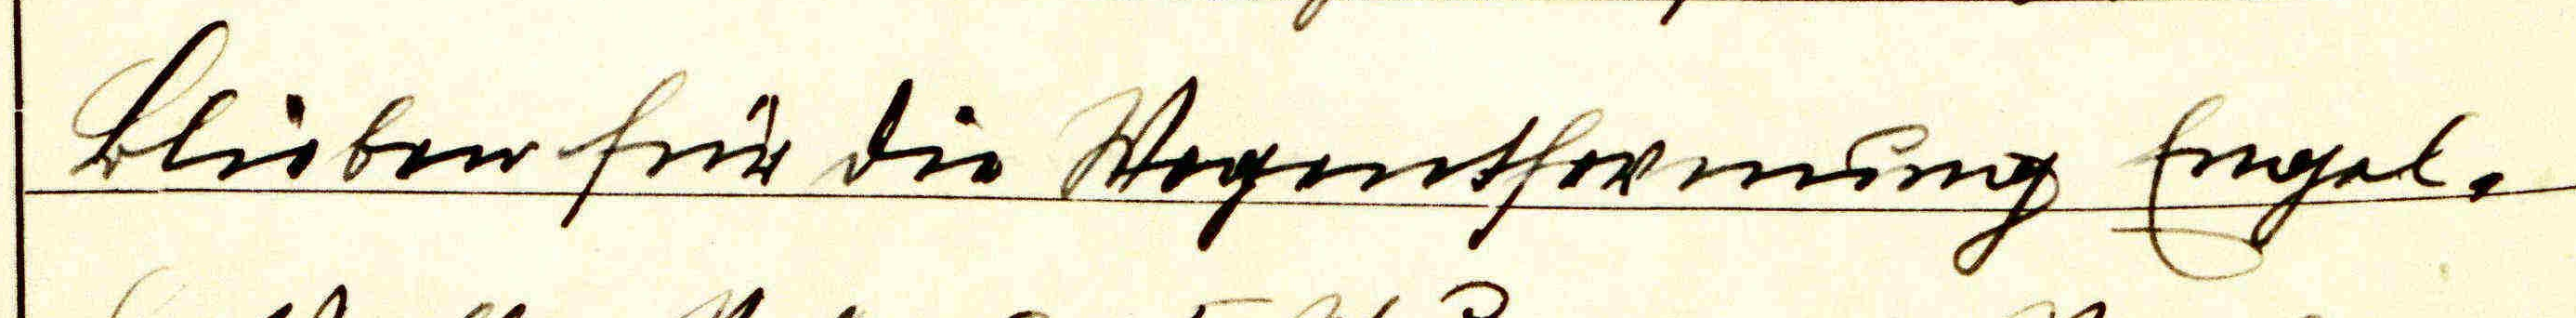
Bleiben für die Wegentfernung Engel-
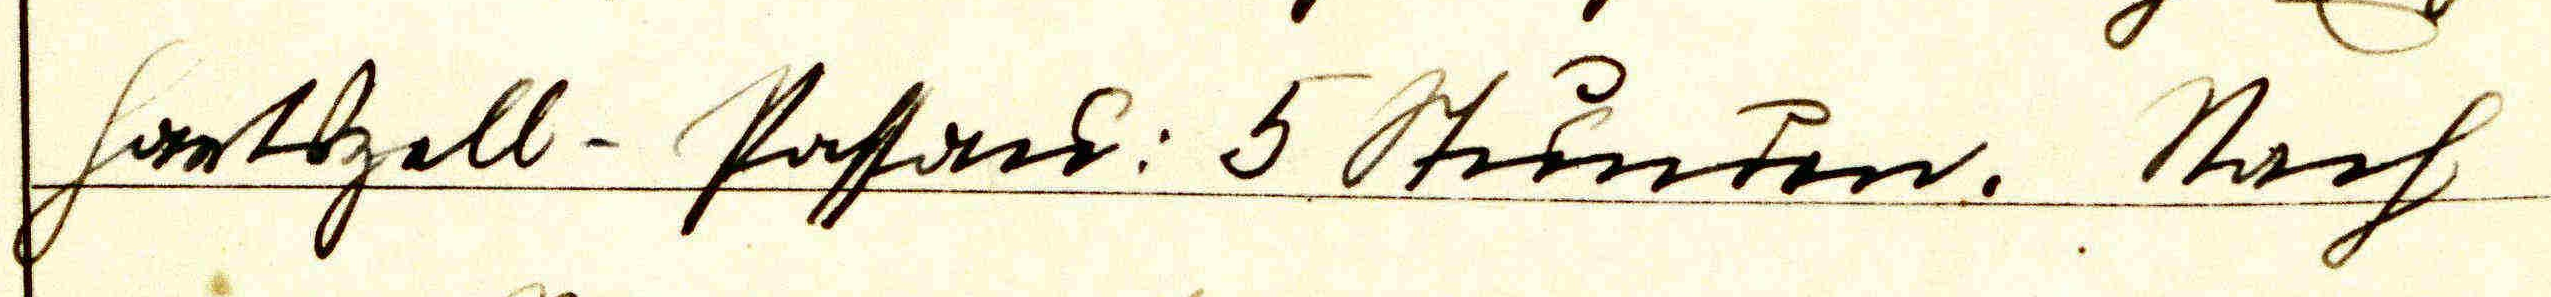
hartszell-Passau: 5 Stunden. Nach
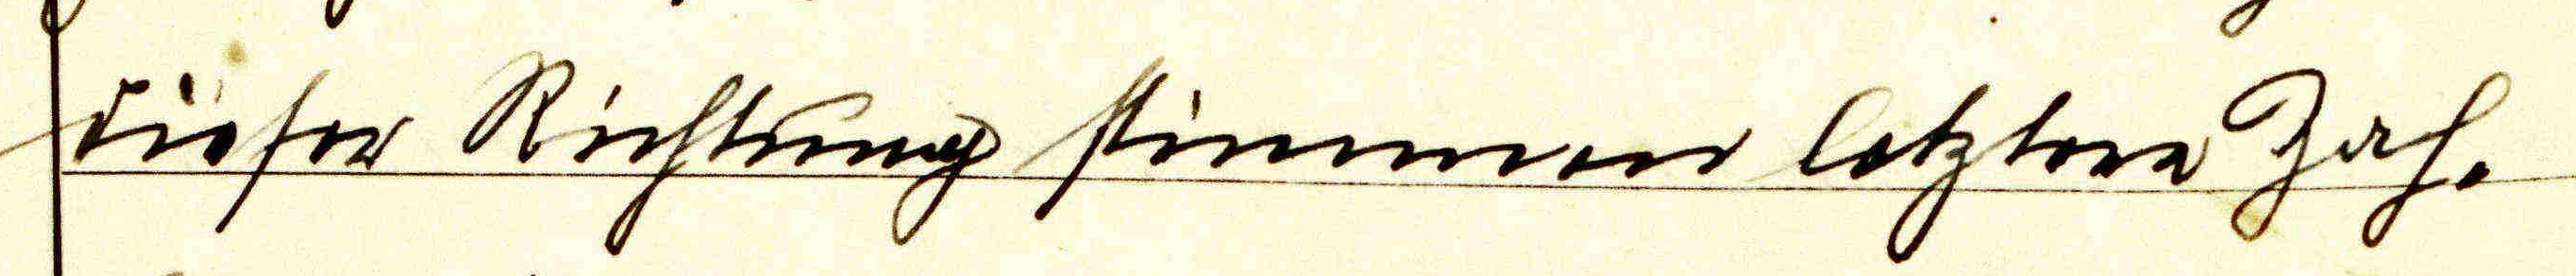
dieser Richtung stimmen letztere Zah-
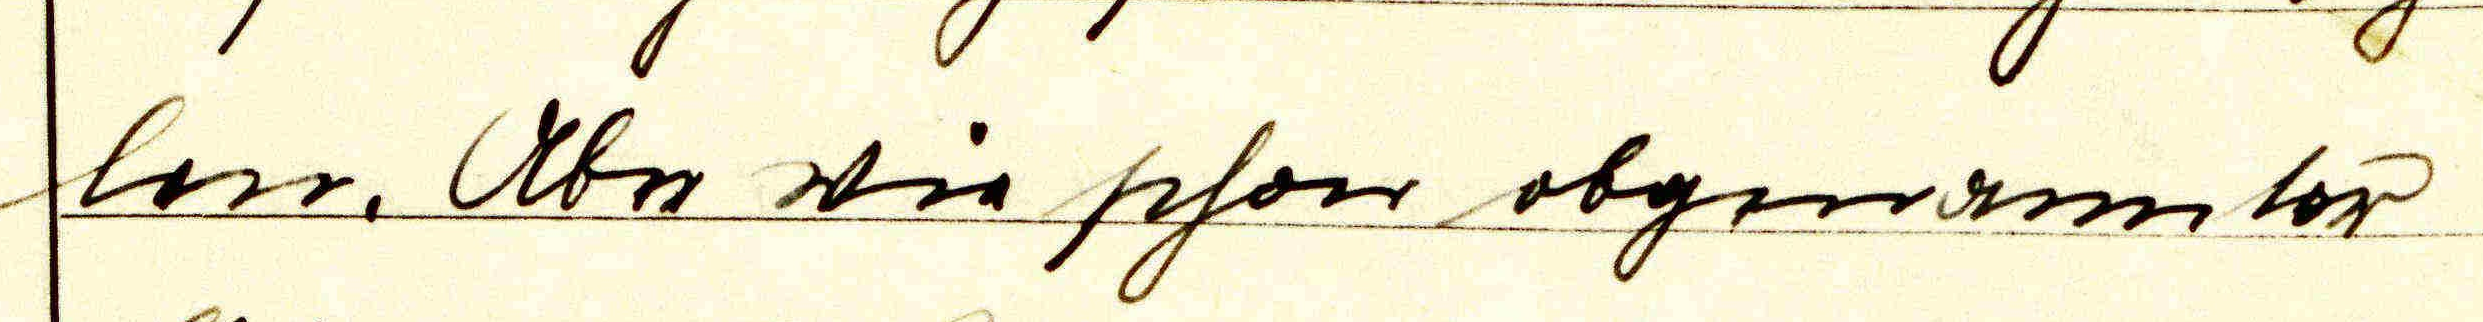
len. Aber wie schon obgenannter
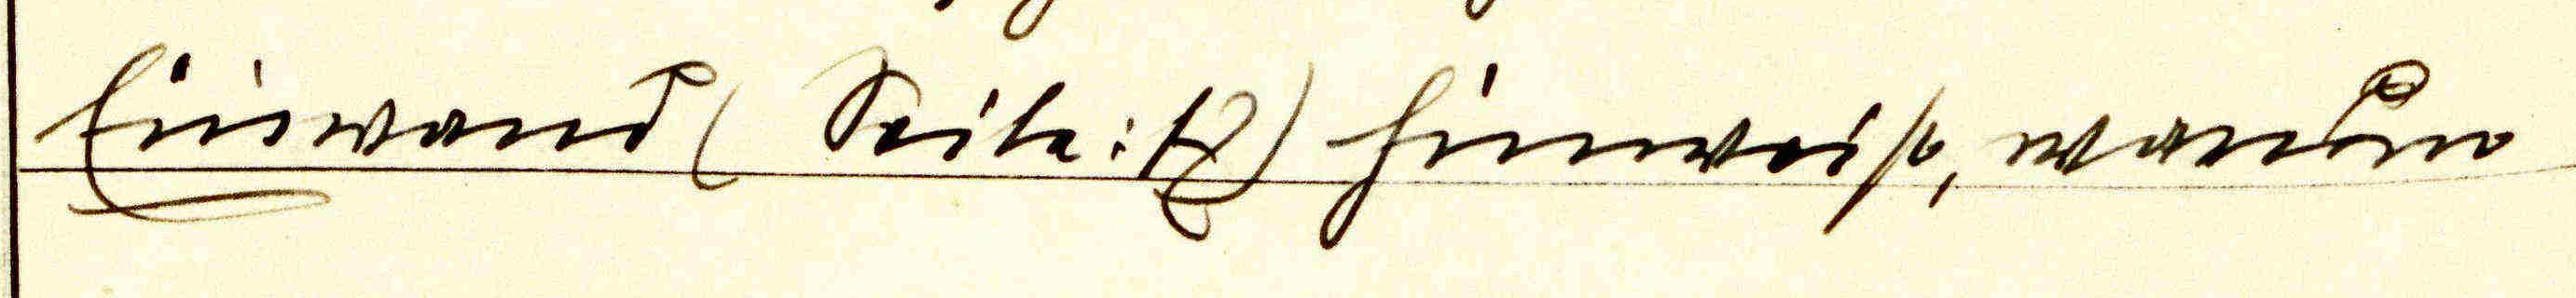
Einwand (Seite 17) hinweise, warum
